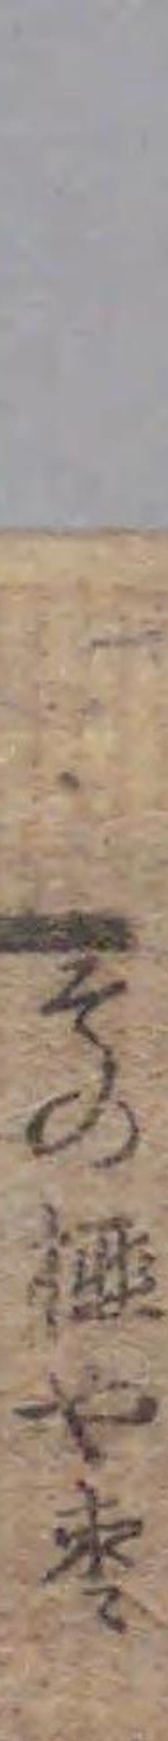その榧や棗
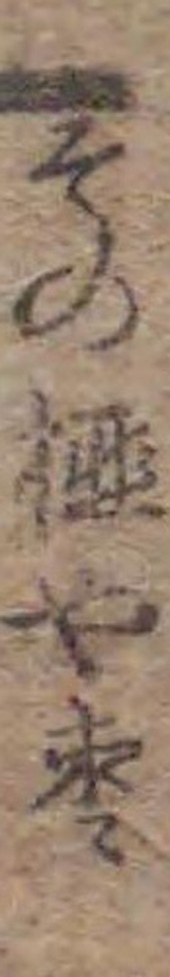その榧や棗
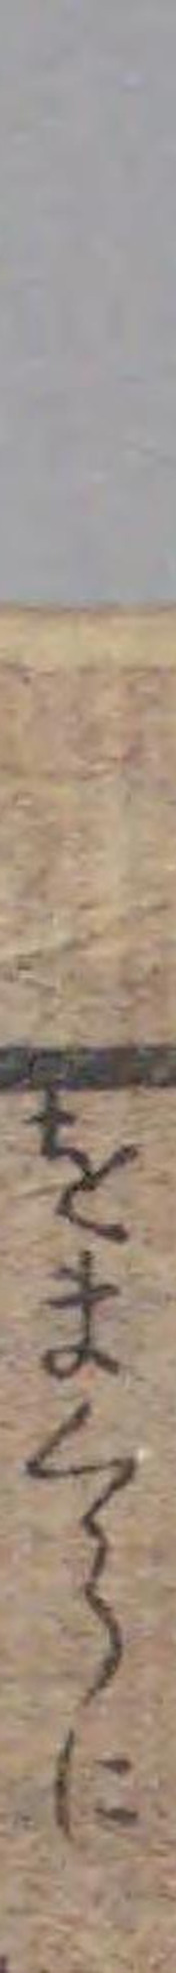をまくらに
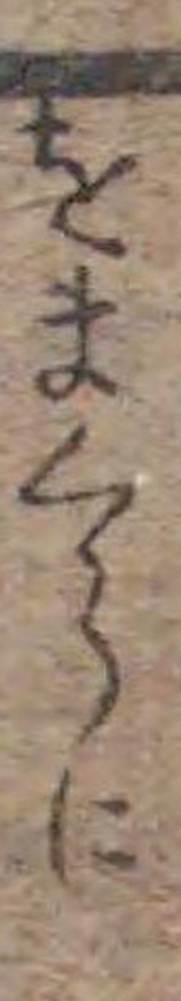をまくらに
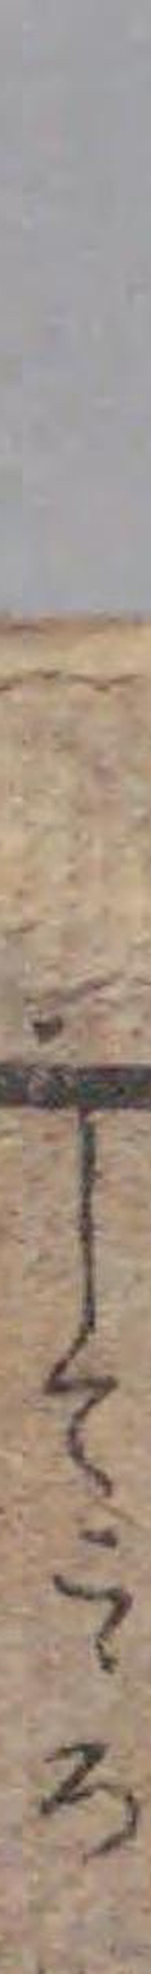してこゝろ
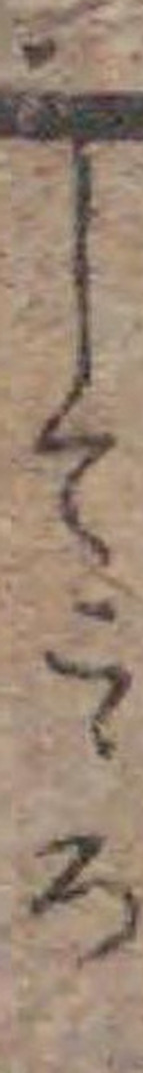してこゝろ
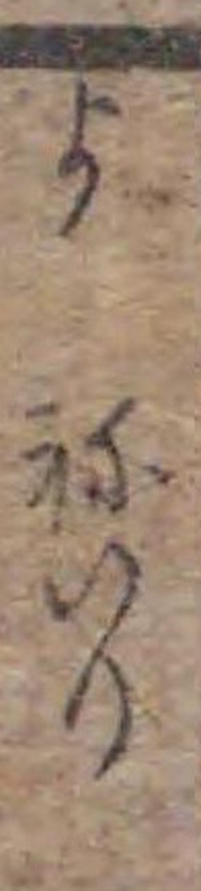よねいり
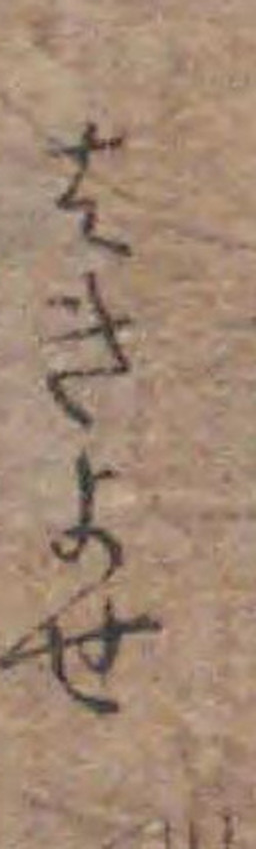はきよせ
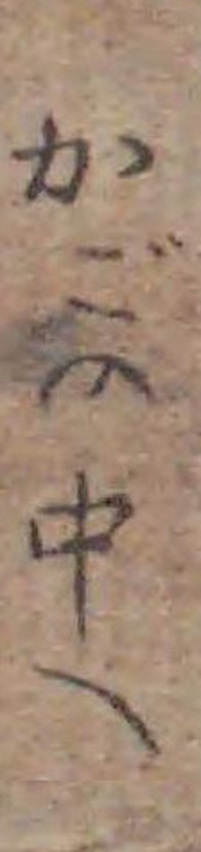かごの中へ
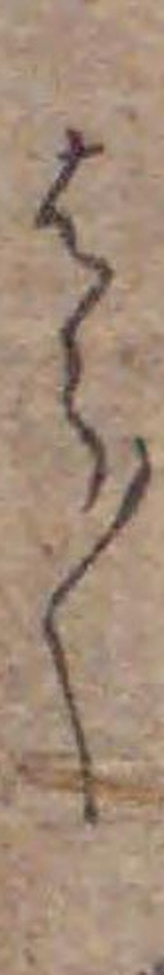はら〳〵

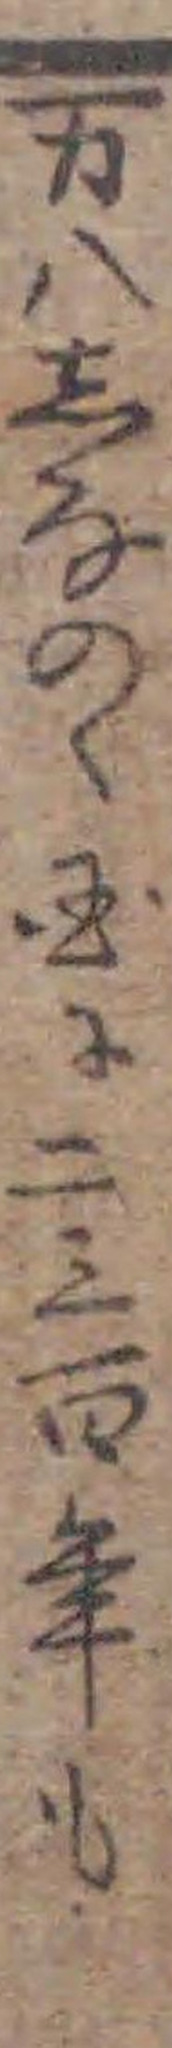万八しなのゝ国に二三百年も
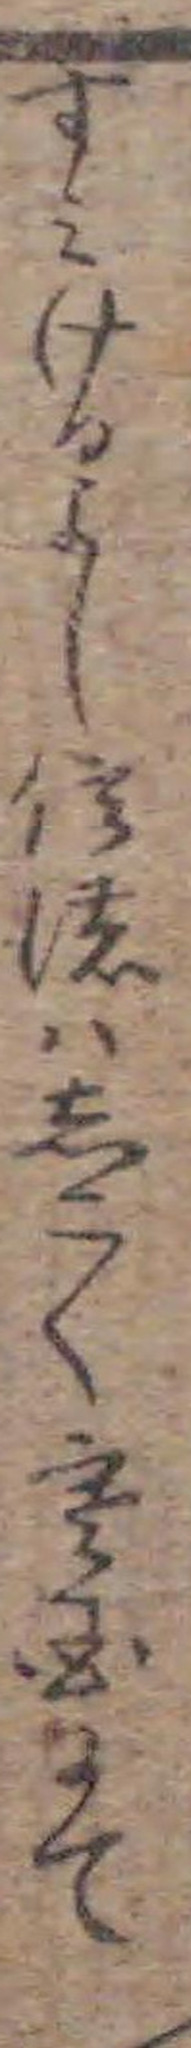すみけるよし信濃はしこく寒国にて
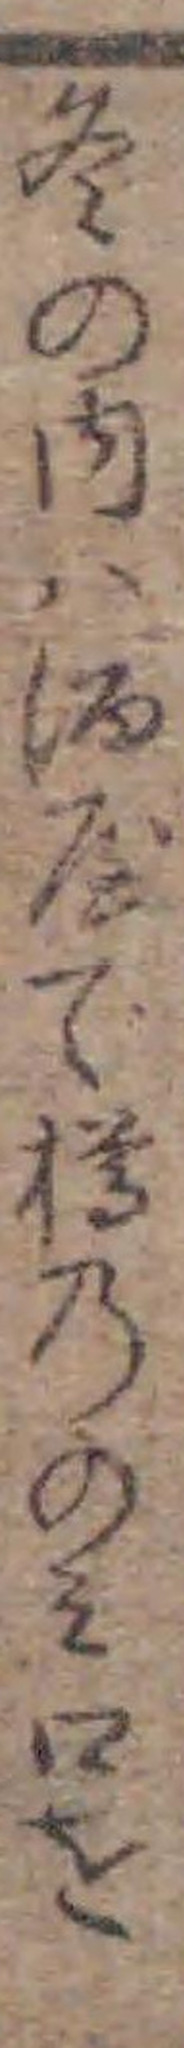冬の内は酒屋で樽ののみ口を
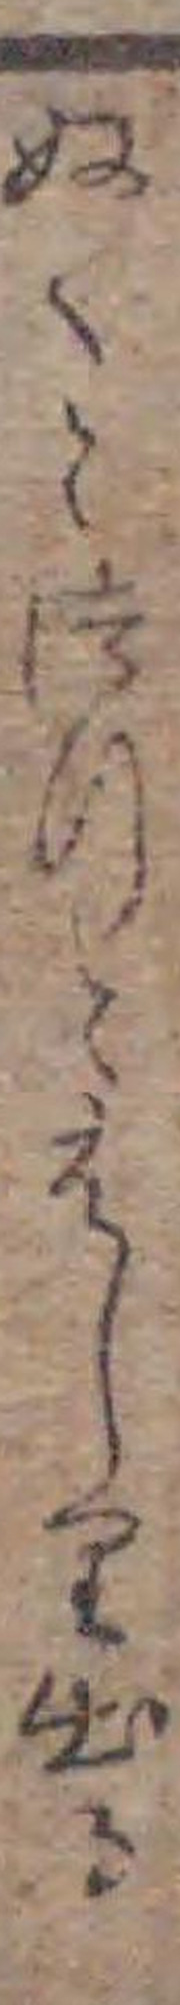ぬくとつつとはしり出る
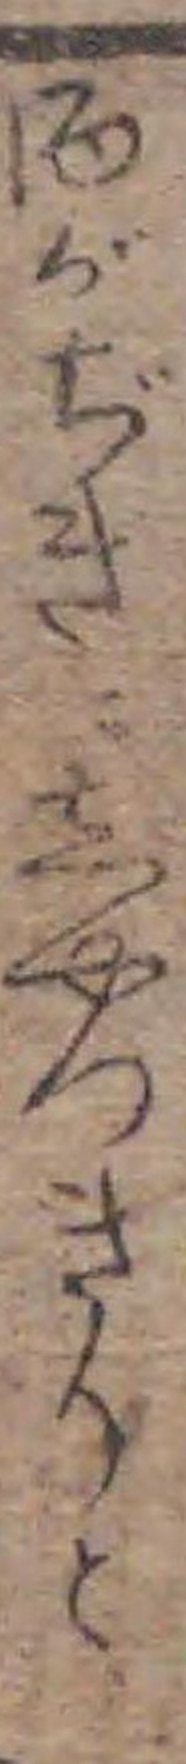酒がぢきにしやつきりと
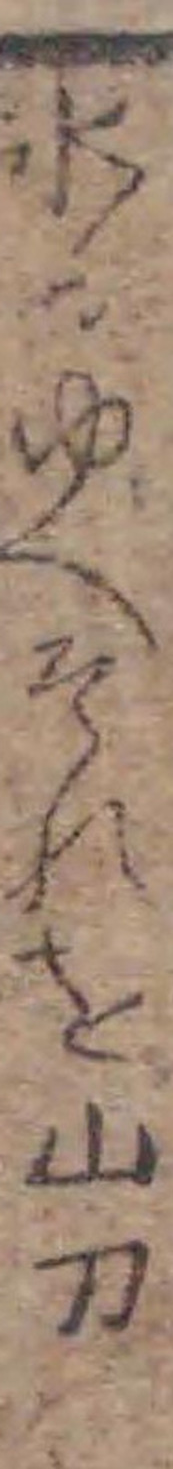氷るゆへそれを山刀
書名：虚言八百万八伝 : 3巻
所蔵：国立国会図書館 National Diet Library, JAPAN
